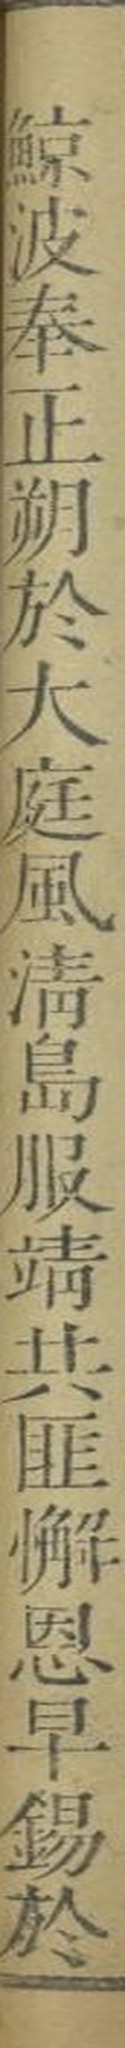鯨波奉正朔於大庭風淸島服靖共匪懈恩早錫於
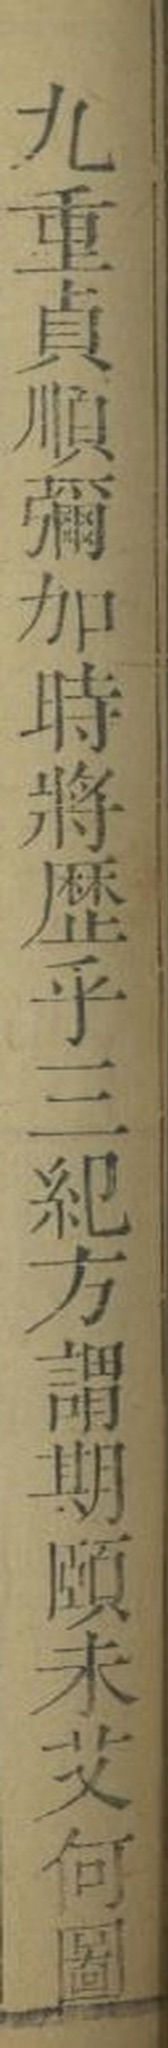九重貞順彌加時將歴乎三紀方謂期頤未艾何圖
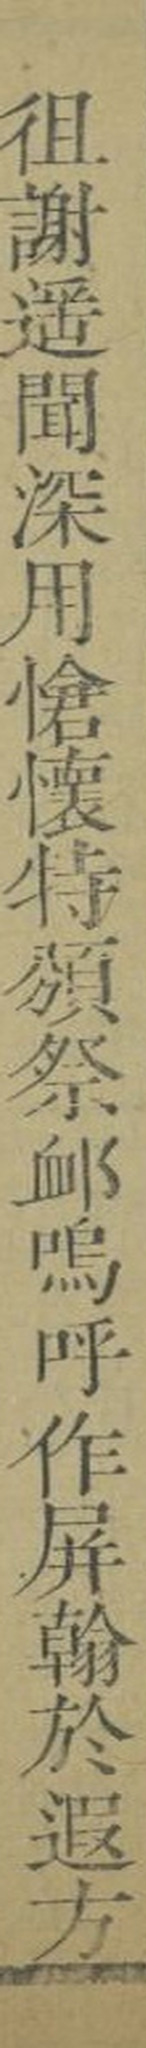徂謝遥聞深用愴懷特領祭䘏嗚呼作屏翰於遐方
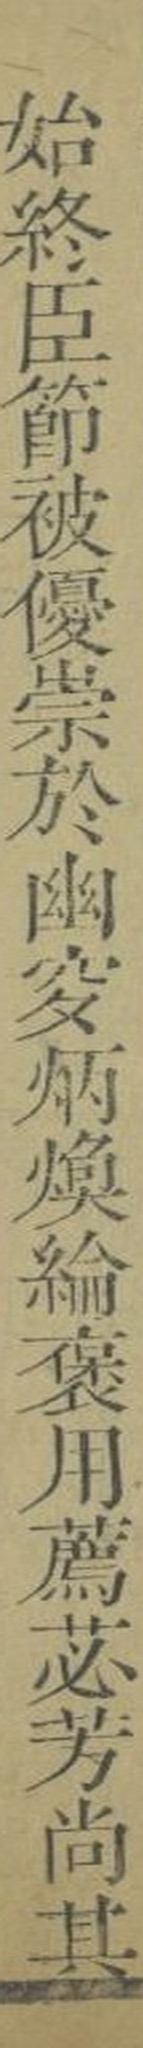始終臣節被優崇於幽穸炳煥綸褒用薦苾芳尚其
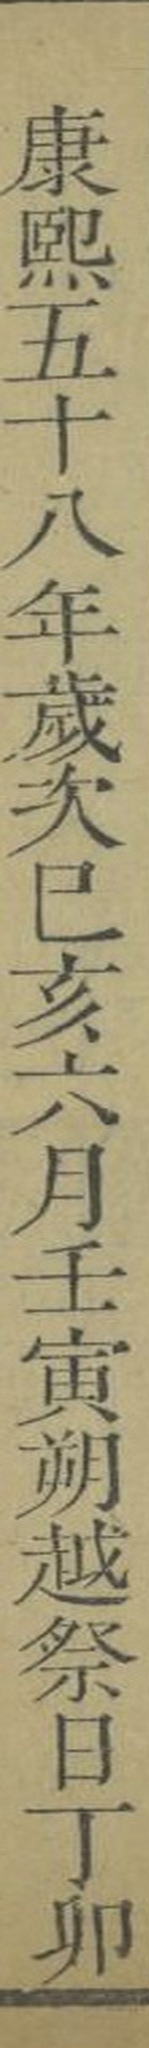康煕五十八年歲次巳亥六月壬寅朔越祭日丁卯
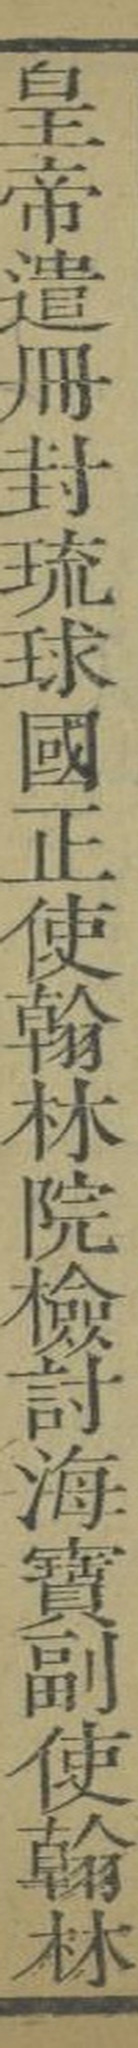皇帝遣冊封琉球國正使翰林院檢討海寶副使翰林
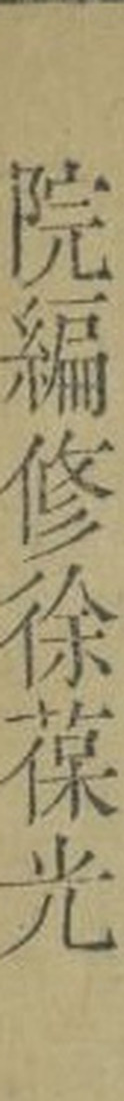院編修徐葆光
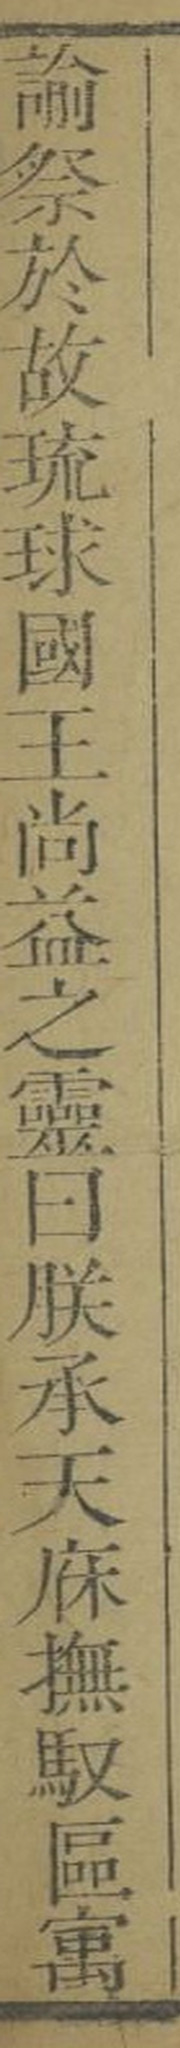諭祭於故琉球國王尚益之靈曰朕承天庥撫馭區㝢

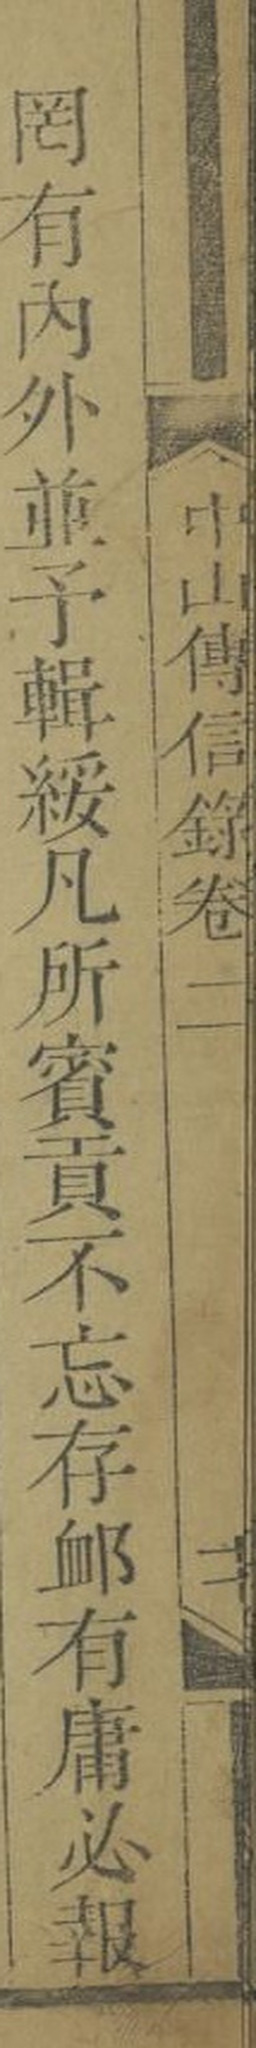罔有内外並予輯綏凡所賓貢不忘存䘏有庸必報
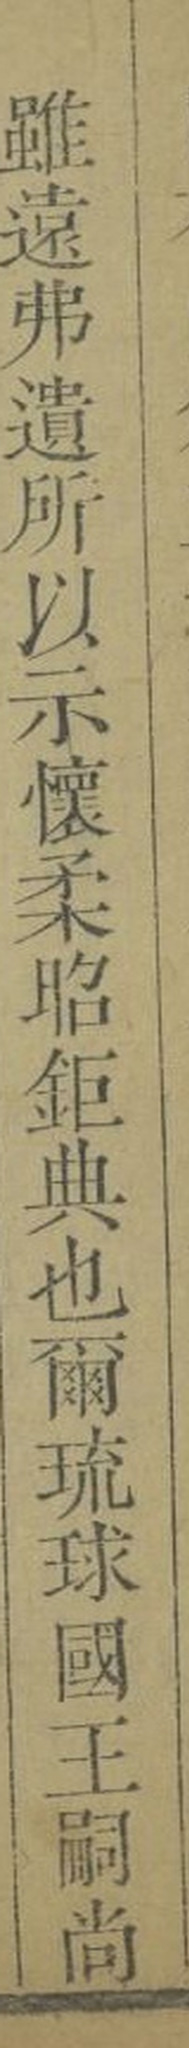雖遠弗遺所以示懷柔昭鉅典也爾琉球國王嗣尚
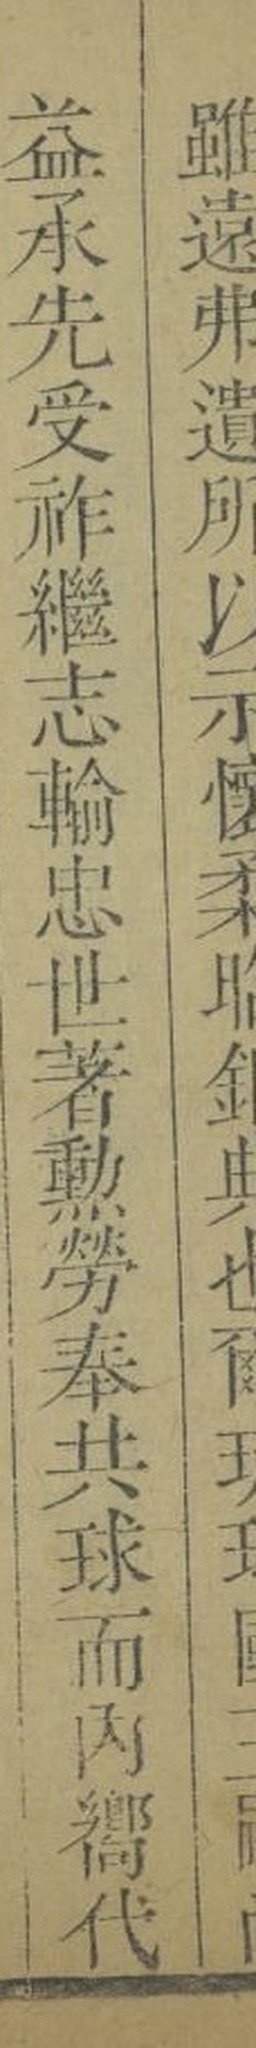益承先受祚繼志輪忠世著勳勞奉共球而内嚮代
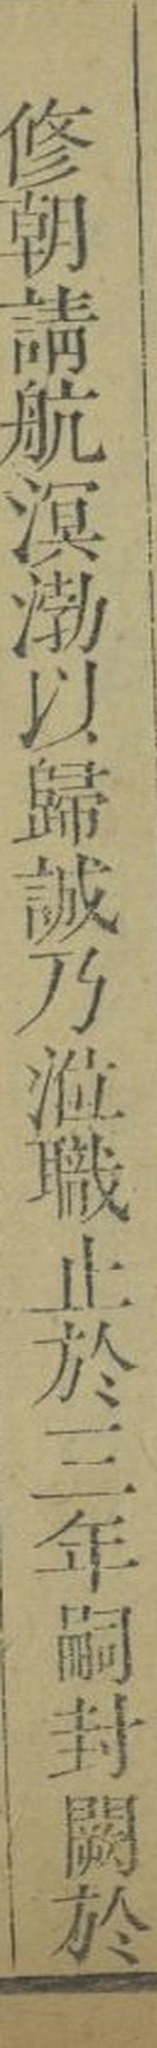修朝請航溟渤以歸誠乃涖職止於三年嗣封闕於
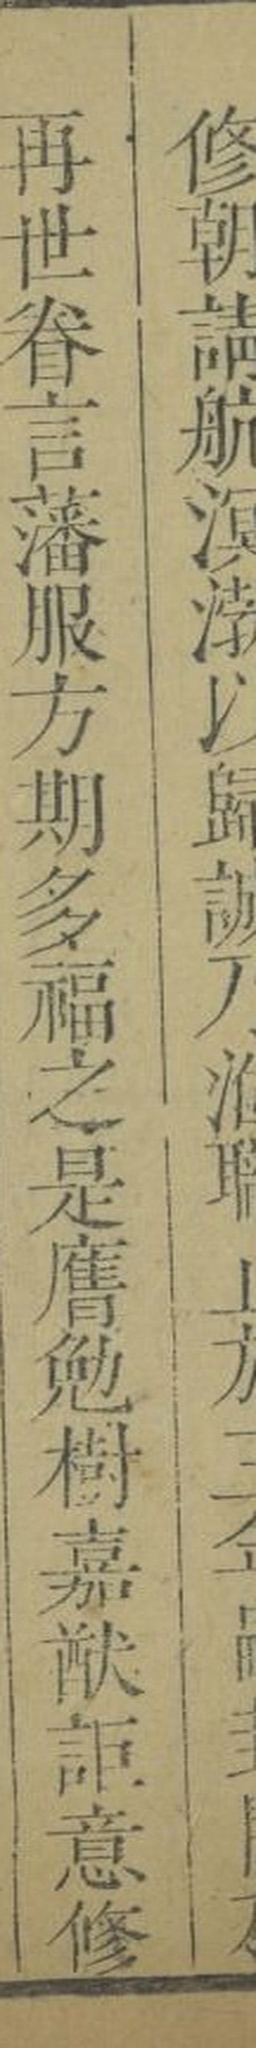再世眷言藩服方期多福之是膺勉樹嘉猷詎意修
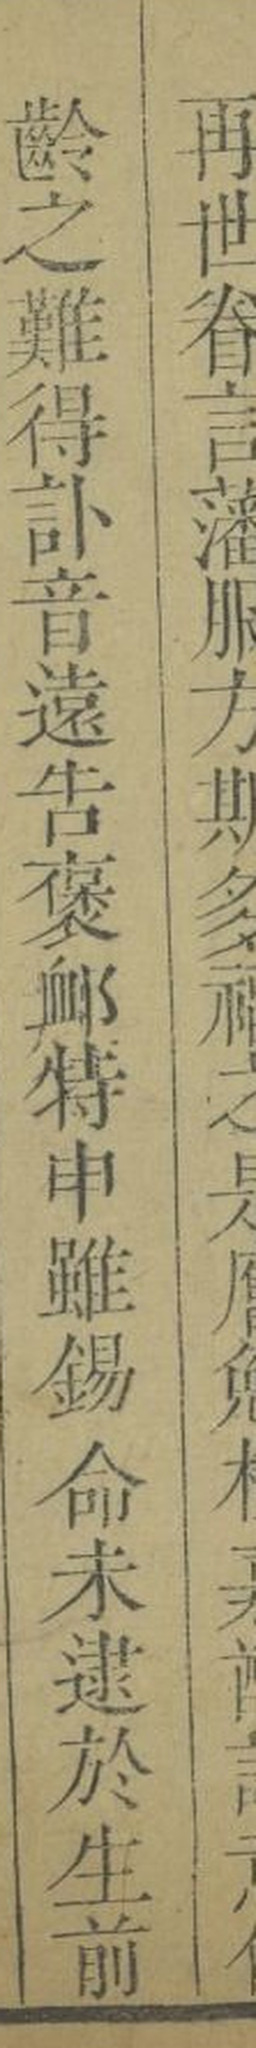齡之難得訃音遠告褒䘏特申雖錫命未逮於生前
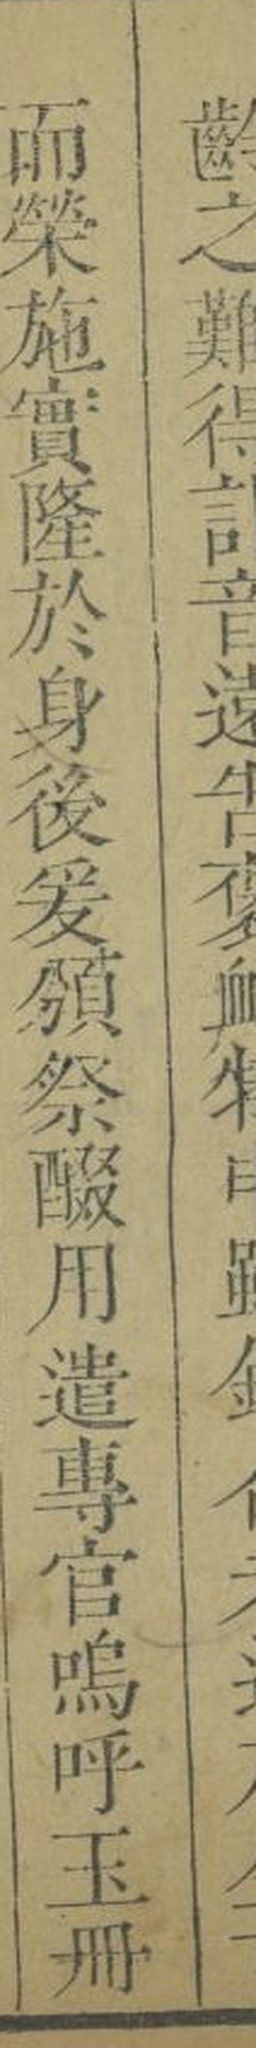而榮施實隆於身後爰頒祭醊用遣專官嗚呼玉冊
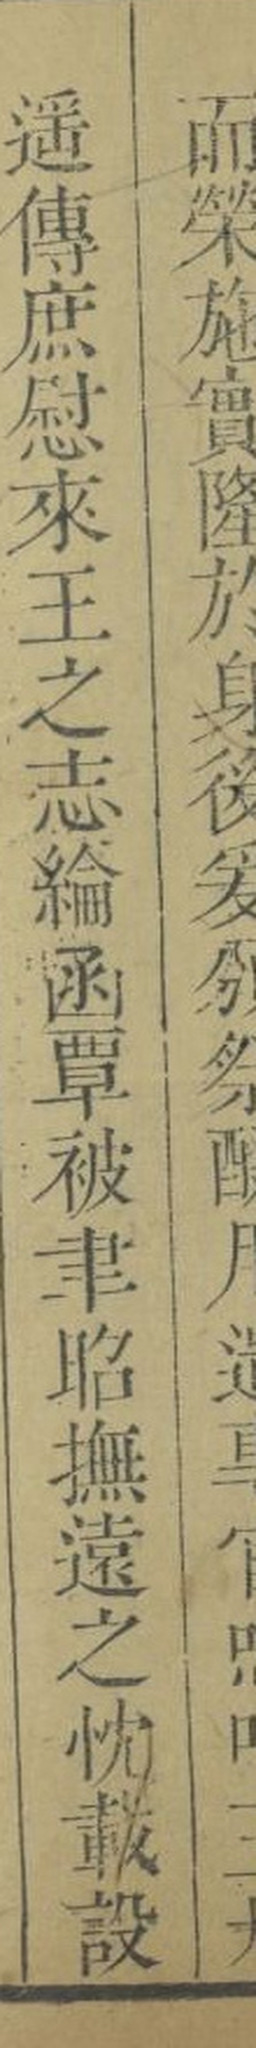遥傳庶慰來王之志綸函覃被聿昭撫遠之忱載設
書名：中山伝信録 巻二
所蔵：University of the Ryukyus Library
